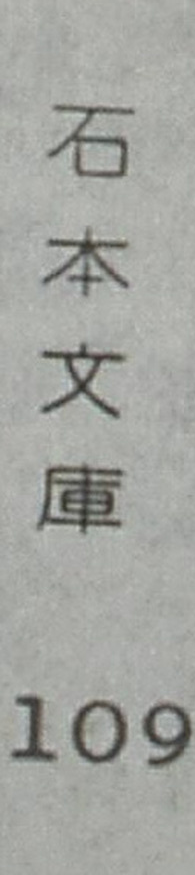石本文庫
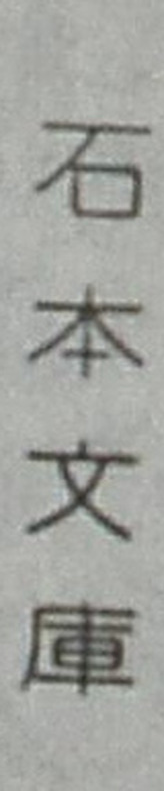石本文庫
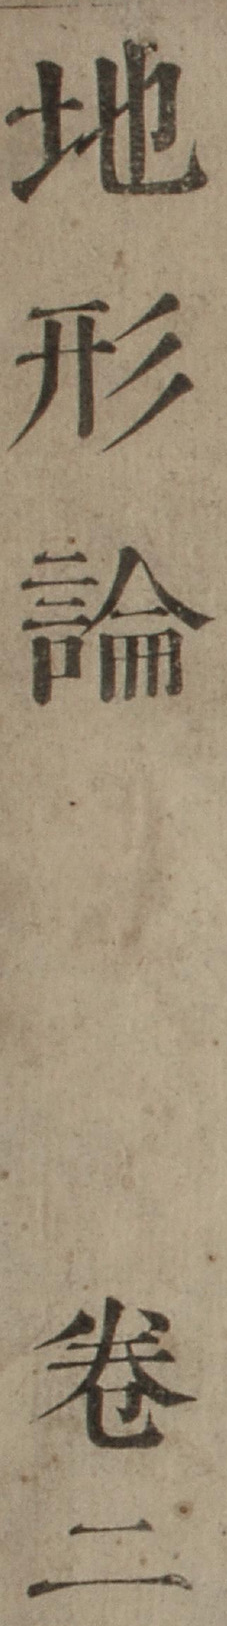地形論巻二

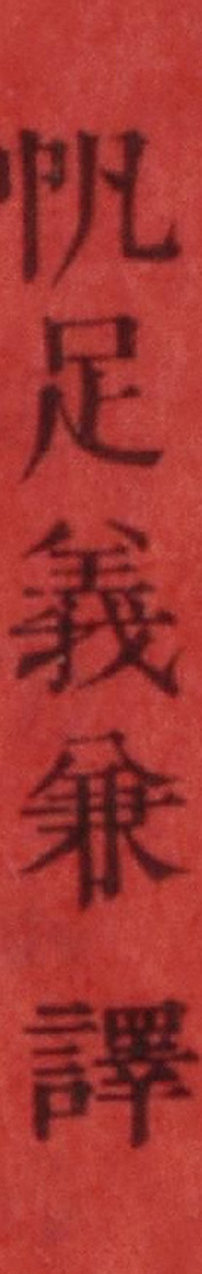帆足義兼訳
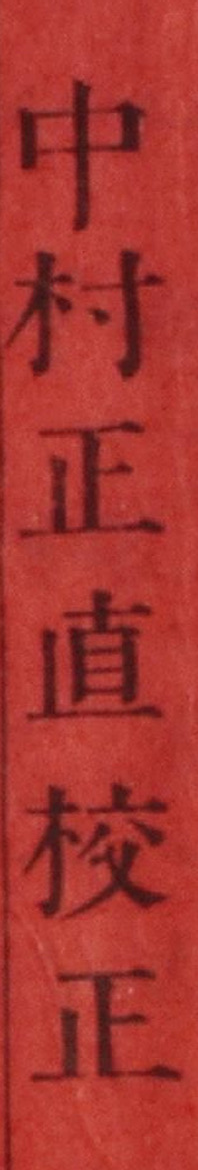中村正直校正
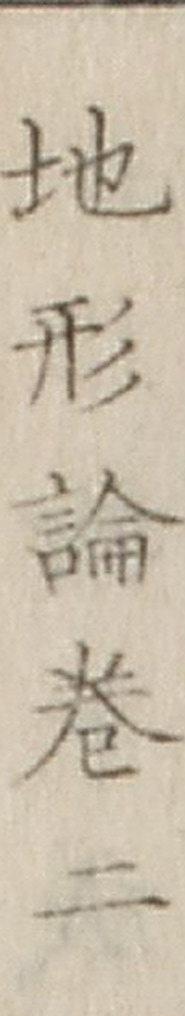地形論巻二
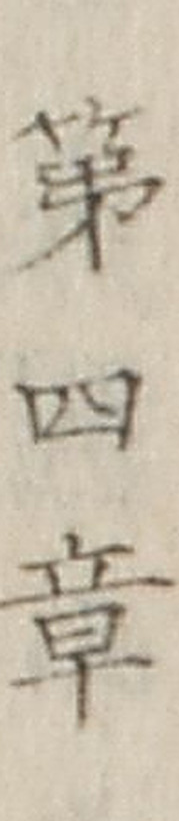第四章
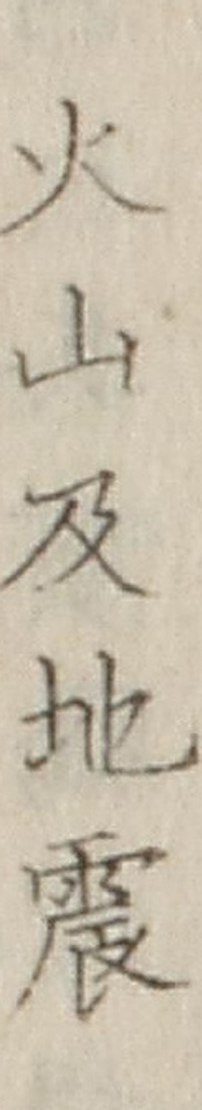火山及地震
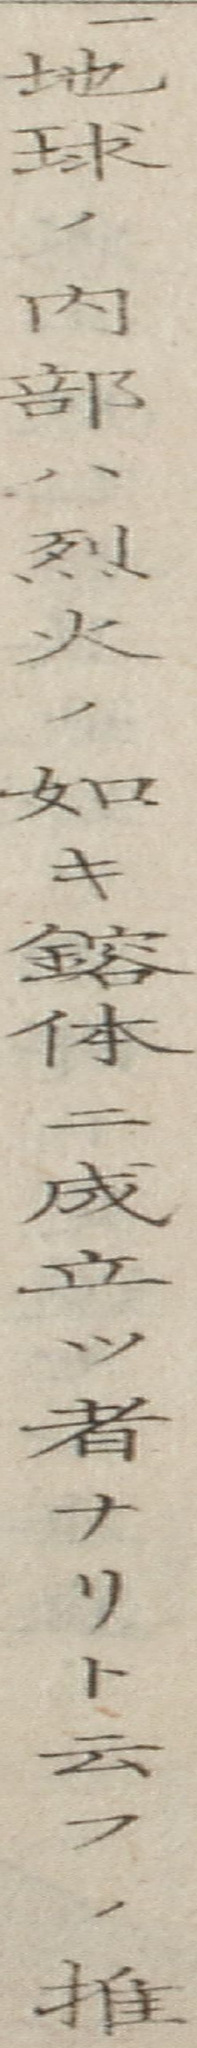一地球ノ内部ハ烈火ノ如キ鎔体ニ成立ツ者ナリト云フノ推
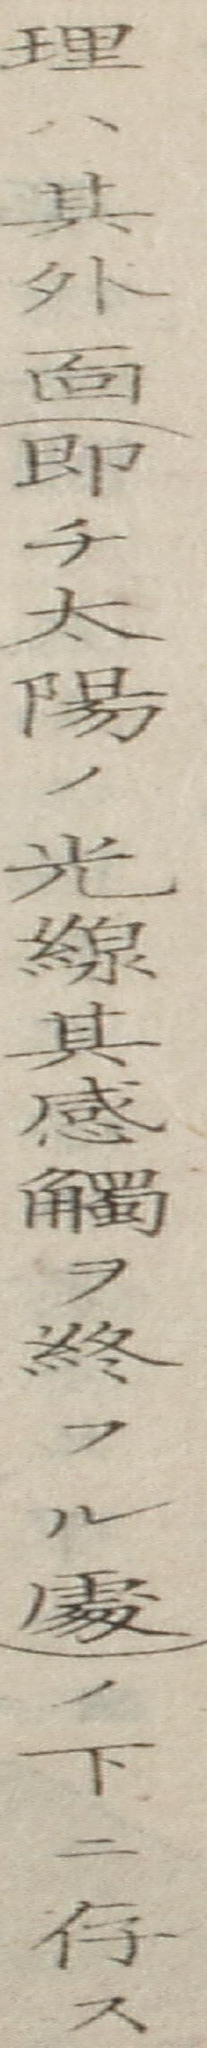理ハ其外面ノ下ニ存ス
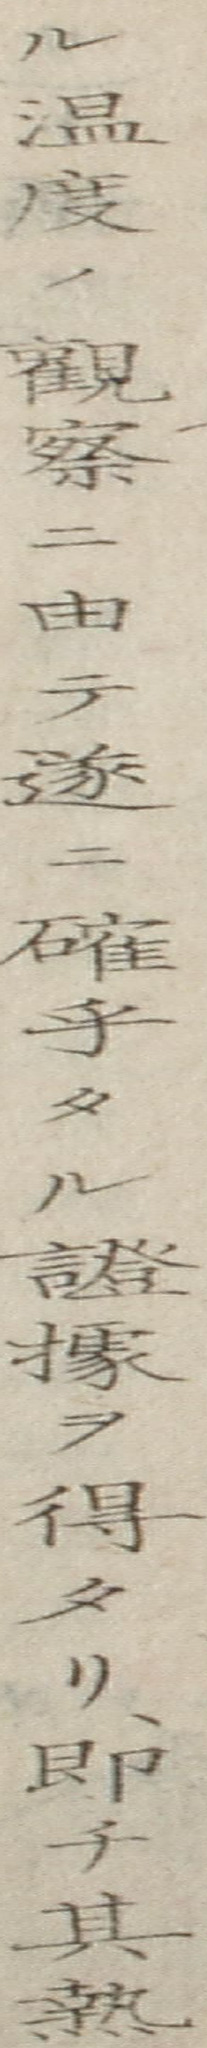ル温度ノ観察ニ由テ遂ニ確乎タル証拠ヲ得タリ、即チ其熱
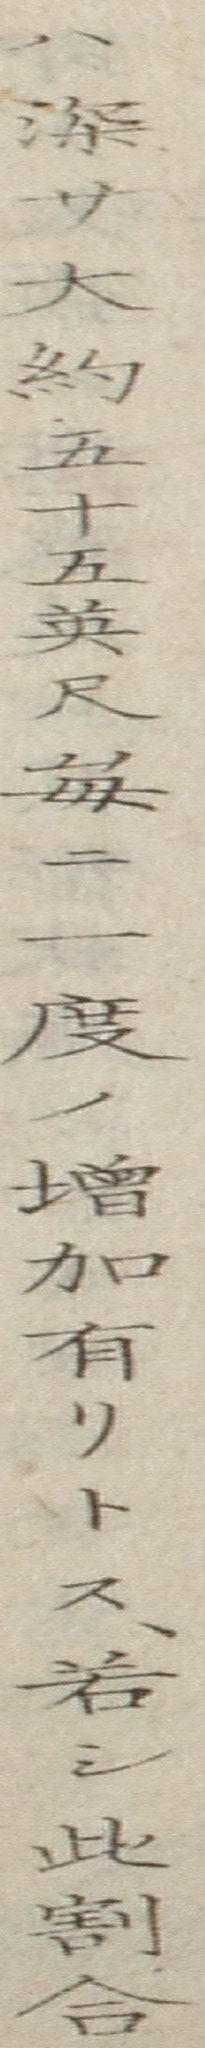ハ深サ大約五十五英尺毎ニ一度ノ増加有リトス、若シ此割合
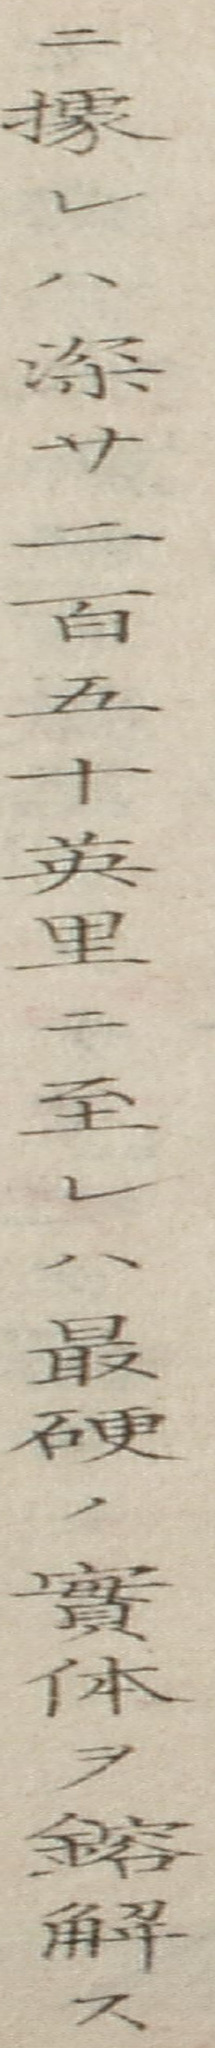ニ拠レハ深サ二百五十英里ニ至レハ最硬ノ実体ヲ鎔解ス
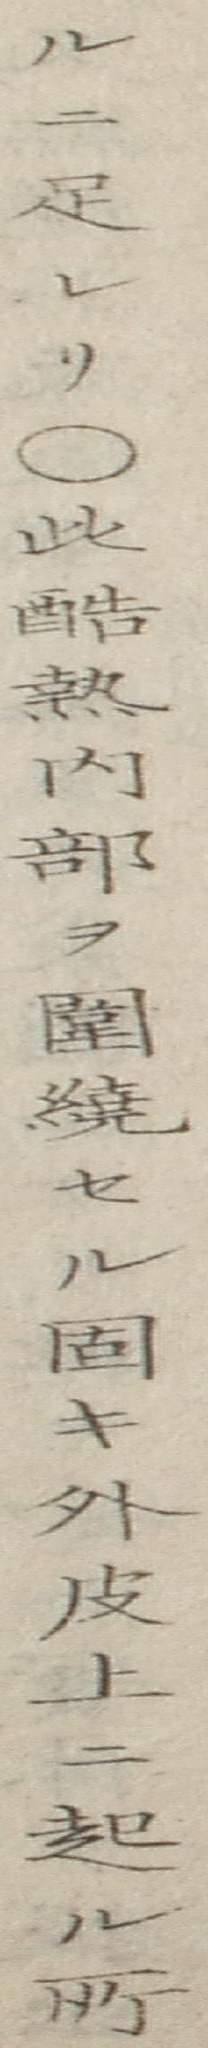ルニ足レリ○此酷熱内部ヲ囲繞セル固キ外皮上ニ起ル所
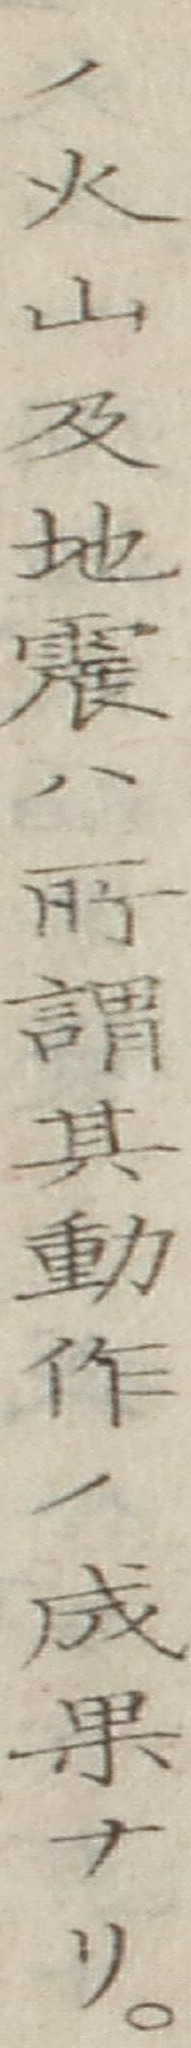ノ火山及地震ハ所謂其動作ノ成果ナリ。
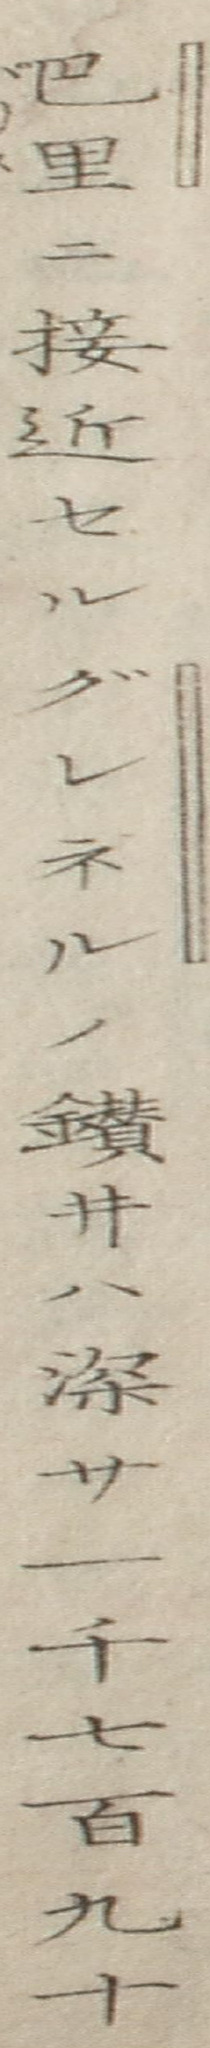巴里ニ接近セルグレネルノ鑚井ハ深サ一千七百九十
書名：地形論　巻二
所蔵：東京大学地震研究所図書室 Earthquake Research Institute Library, The University of Tokyo, JAPAN
